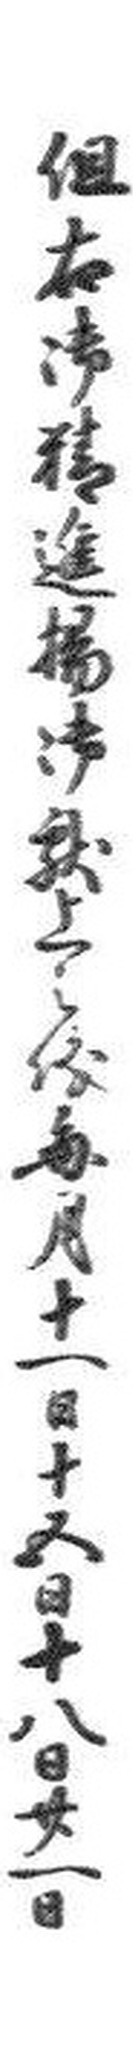但右御精進揚御献上之儀毎月十一日十五日十八日廿一日

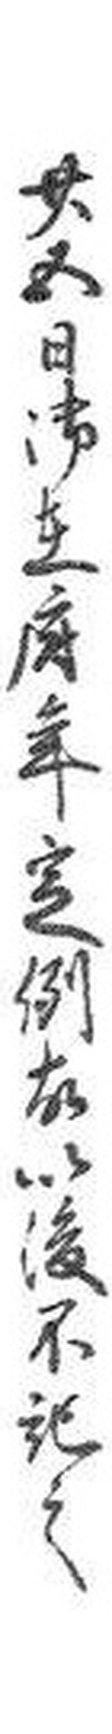廿五日御在府年定例故以後不記之
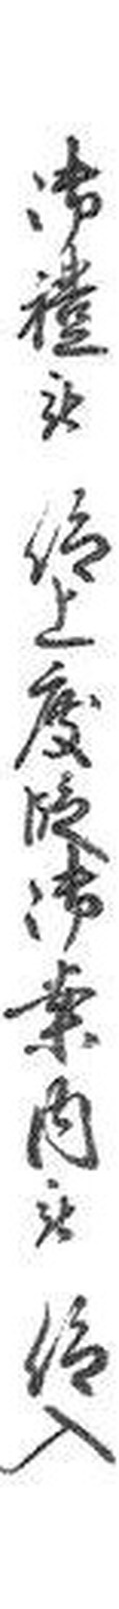御礼被仰上度段御案内被仰入
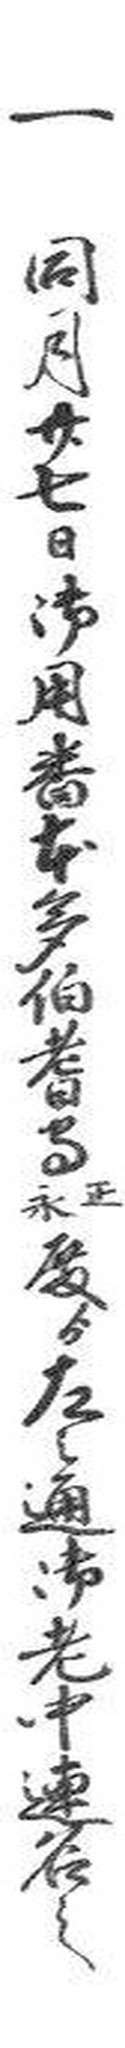一同月廿七日御用番本多伯耆守正永殿ゟ左之通御老中連名之
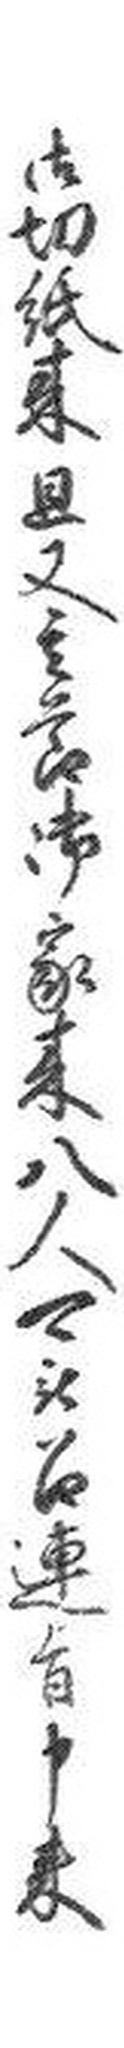御切紙来且又其節御家来八人可被召連旨申来
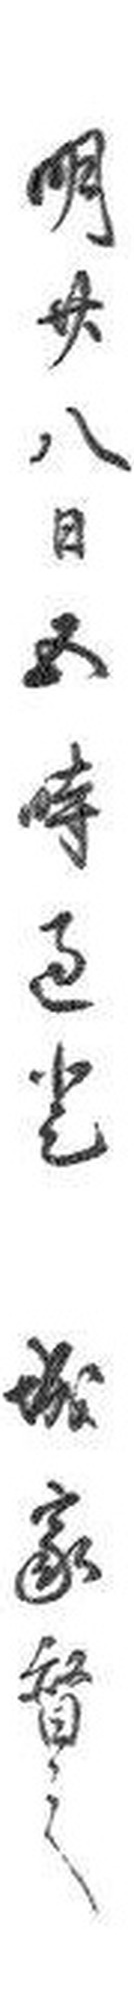明廿八日五時過登城家督之
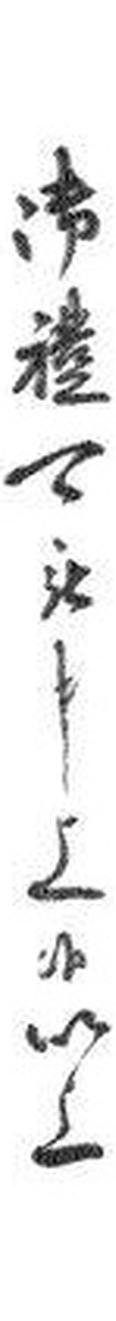御礼可被申上候以上
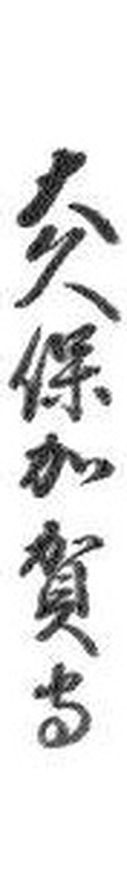大久保加賀守
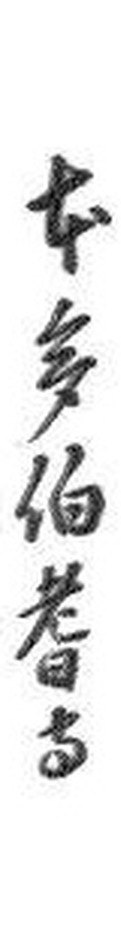本多伯耆守
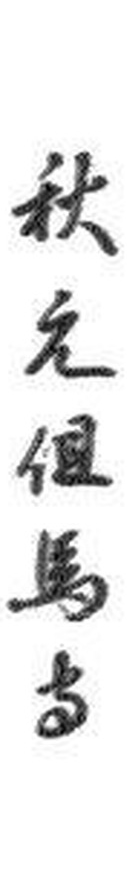秋元但馬守
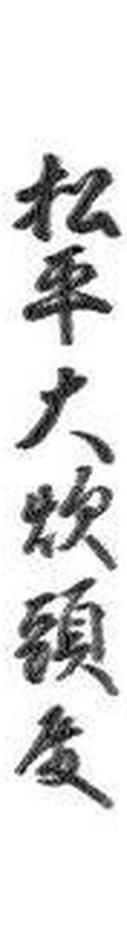松平大炊頭殿
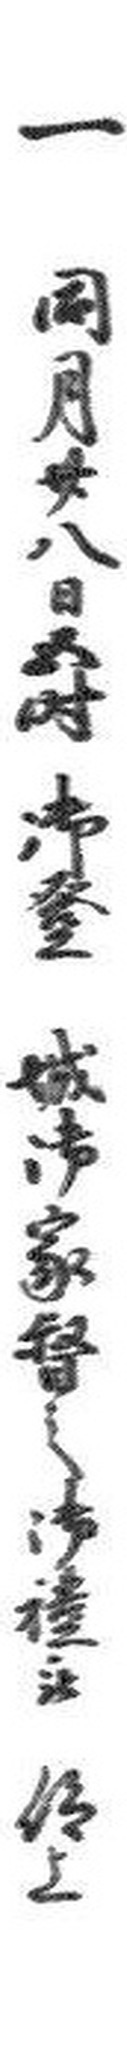一同月廿八日五時御登城御家督之御礼被仰上
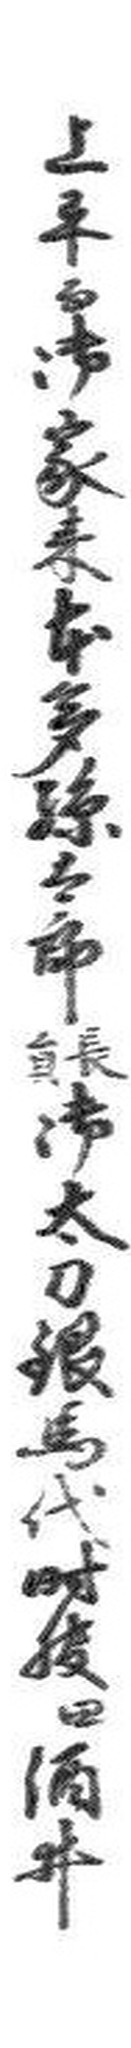上畢而御家来本多孫太郎長員御太刀銀馬代時服四酒井
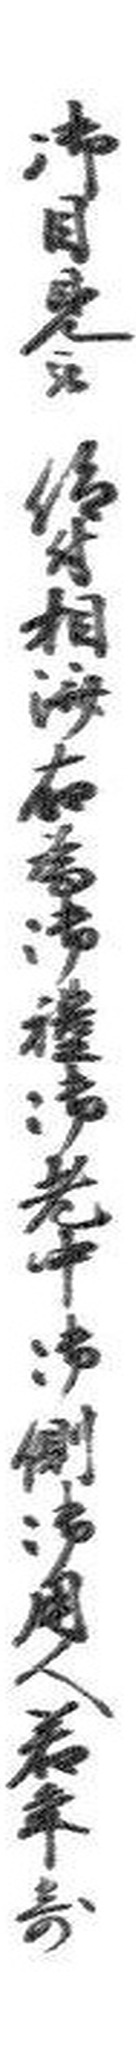御目見被仰付相済右為御礼御老中御側御用人若年寄

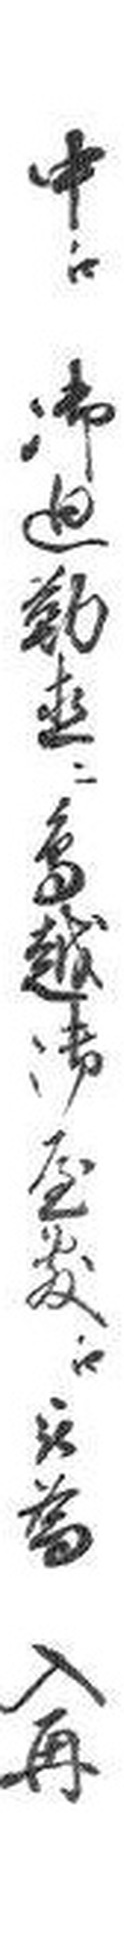中江御廻勤直ニ鳥越御屋敷江被為入再
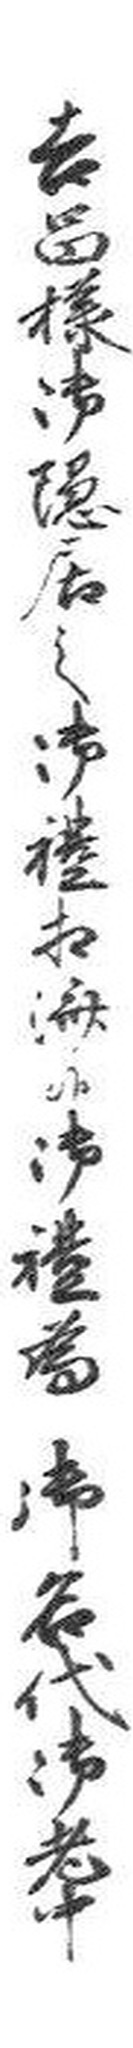吉品様御隠居之御礼相済候御礼為御名代御老中
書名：家譜 二十八 吉邦公 従宝永七年七月五日到正徳元年十二月
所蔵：福井県文書館 Fukui Prefectural Archives
